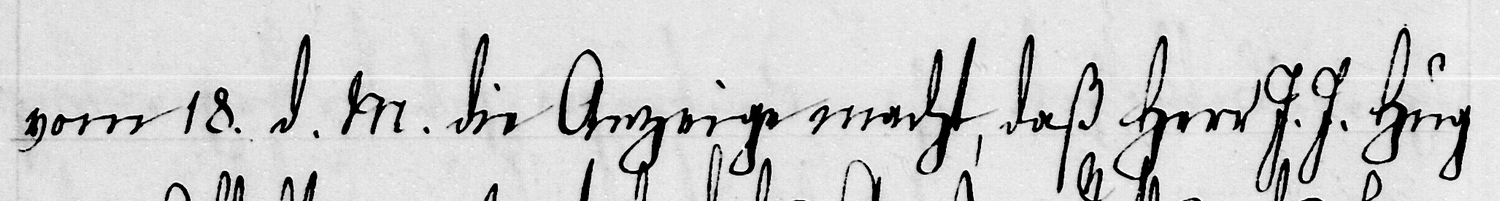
vom 18. d. M. die Anzeige macht, daß Herr J. J. Hug
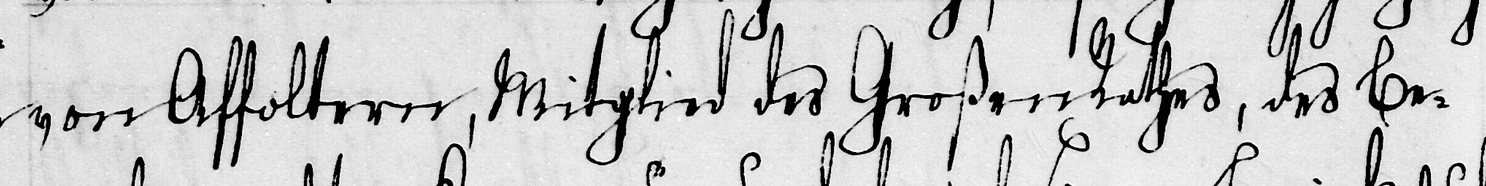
von Affoltern, Mitglied des Großen Rathes, des Be¬
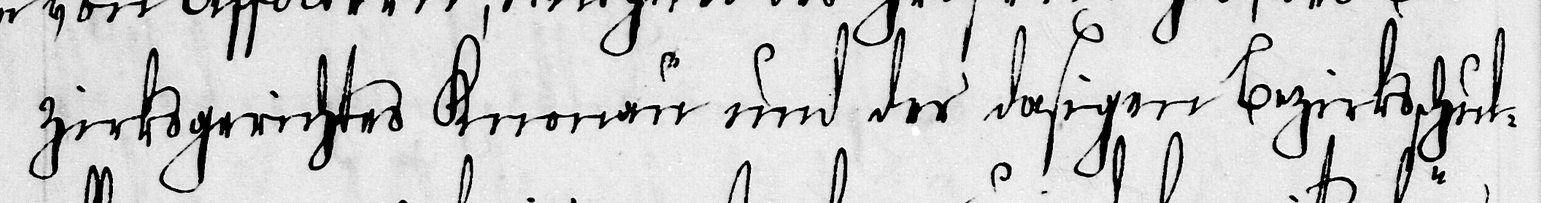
zirksgerichtes Knonau und der dasigen Bezirksschul¬
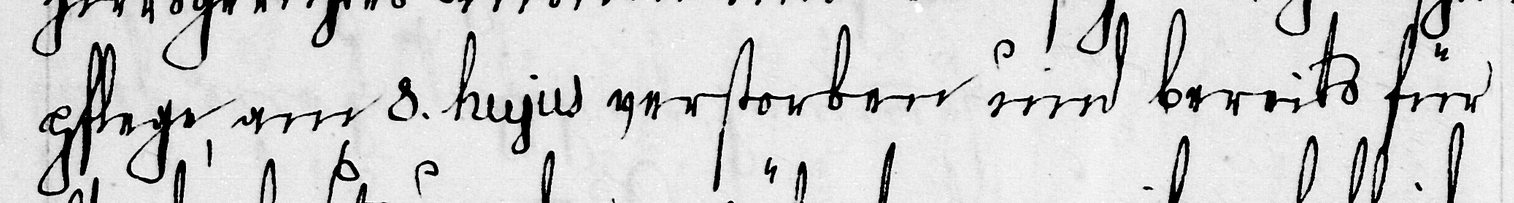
pflege, am 8. hujus verstorben und bereits für
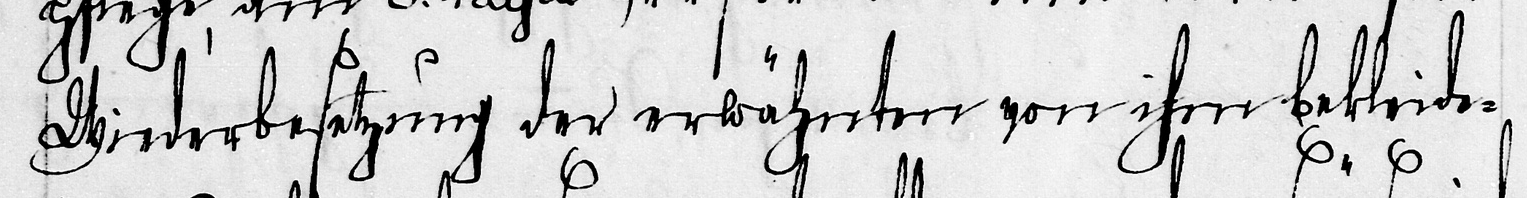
Wiederbesetzung der erwähnten von ihm bekleide¬
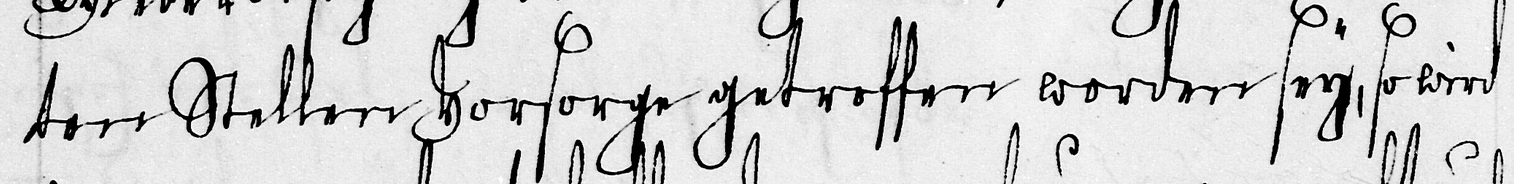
ten Stellen Vorsorge getroffen worden sey, so wird
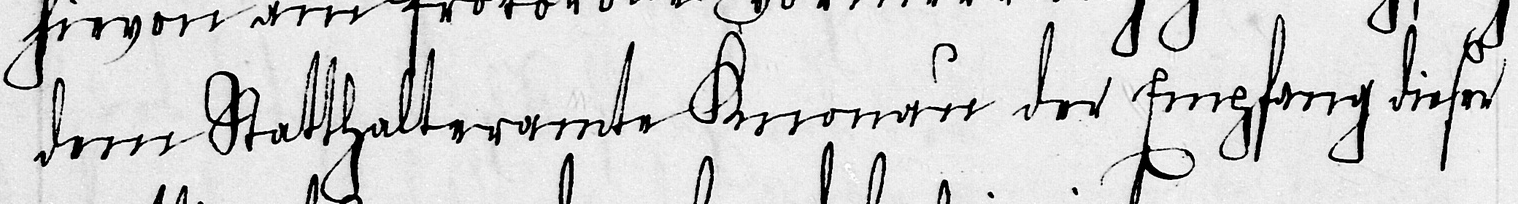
dem Statthalteramte Knonau der Empfang dieser
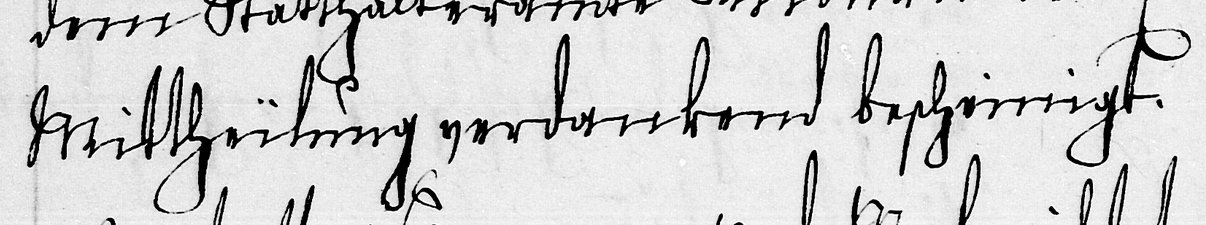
Mittheilung verdankend bescheinigt.
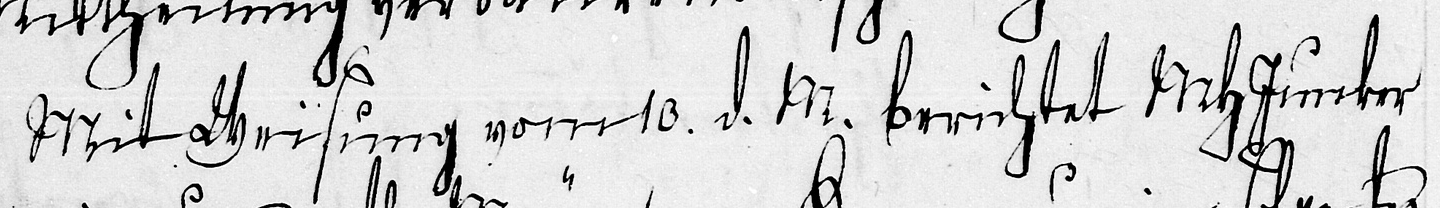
Mit Weisung vom 10. d. M. berichtet MHJunker
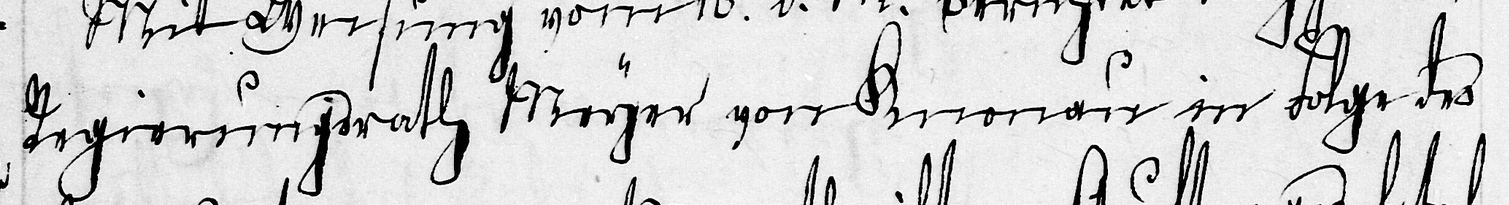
Regierungsrath Meyer von Knonau in Folge des
